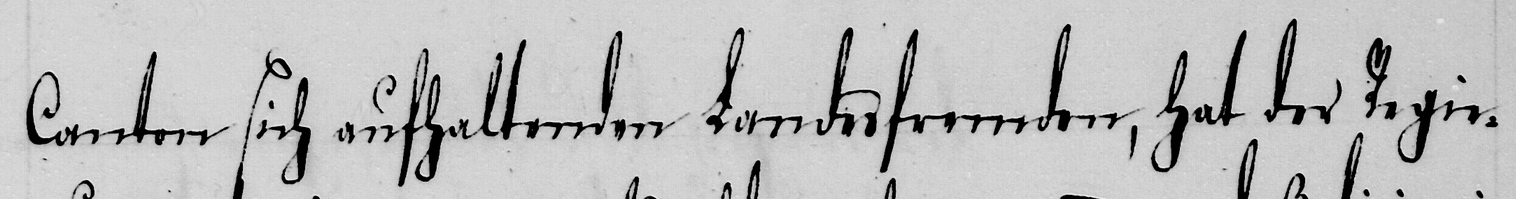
Canton sich aufhaltenden Landesfremden, hat der Regi¬
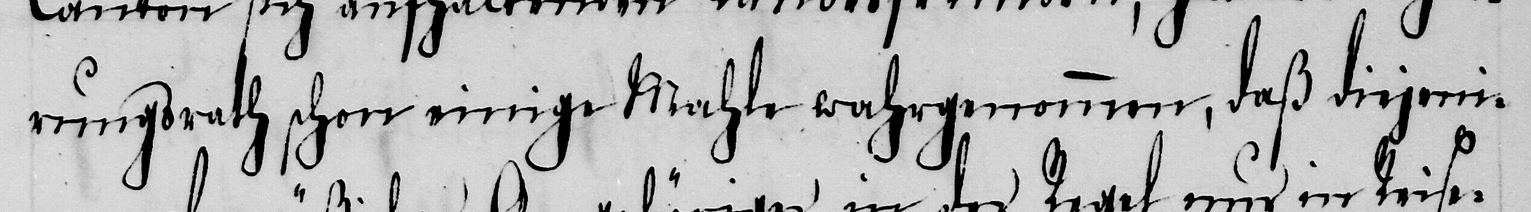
erungsrath schon einige Mahle wahrgenommen, daß diejeni¬
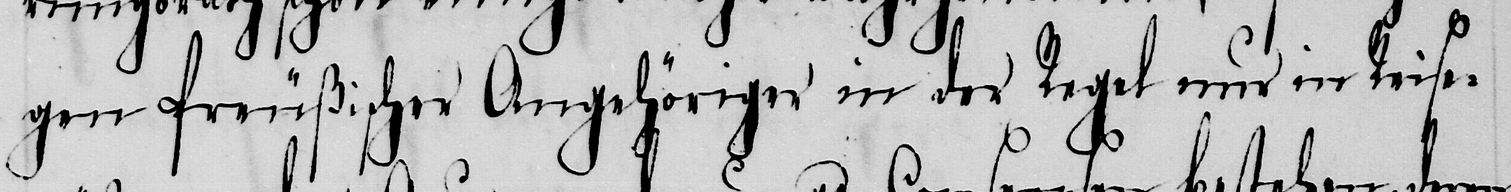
gen Preußischer Angehöriger in der Regel nur in Reise¬
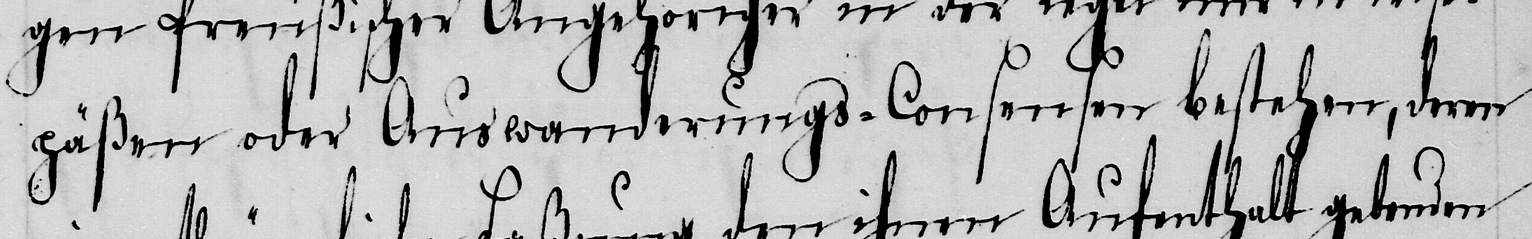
päßen oder Auswanderungs-Consensen bestehen, deren
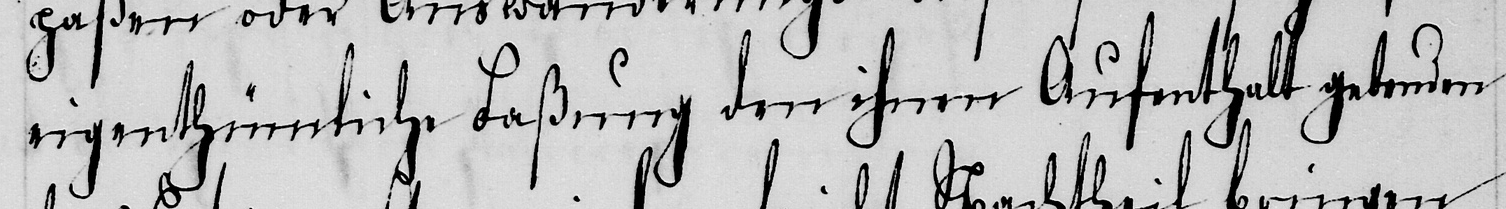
eigenthümliche Faßung den ihnen Aufenthalt gebenden
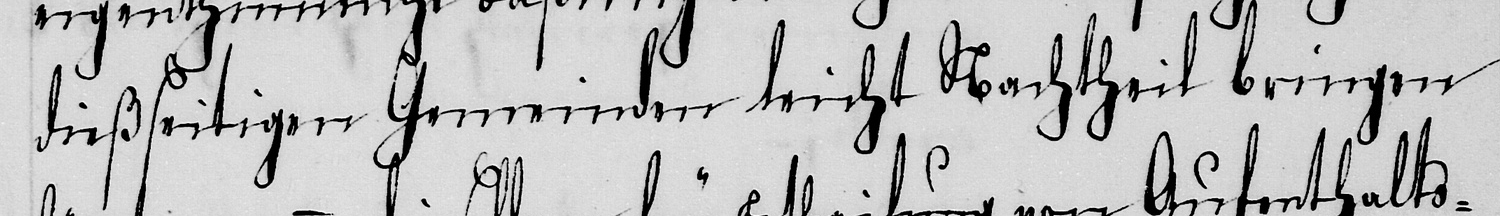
dießseitigen Gemeinden leicht Nachtheil bringen
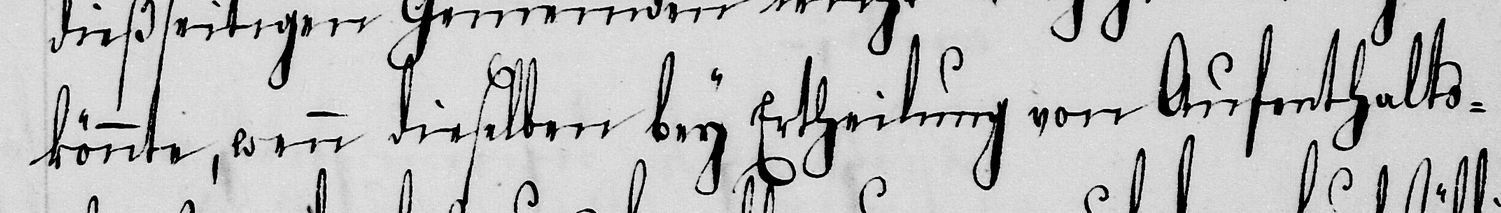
könnte, wenn dieselben bey Ertheilung von Aufenthalts-
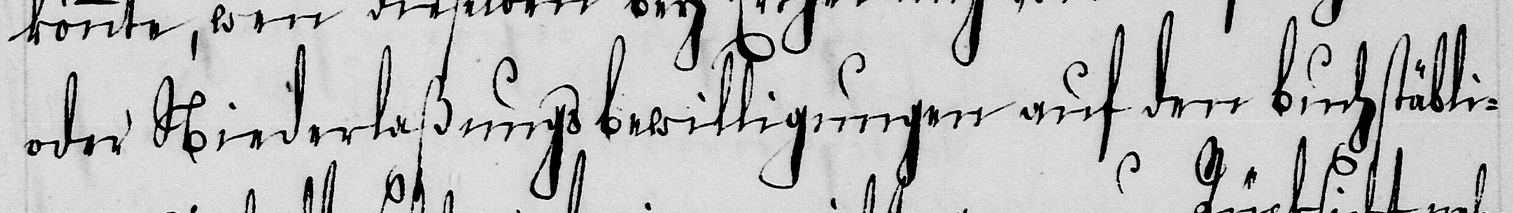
oder Niederlaßungsbewilligungen auf den buchstäbli¬
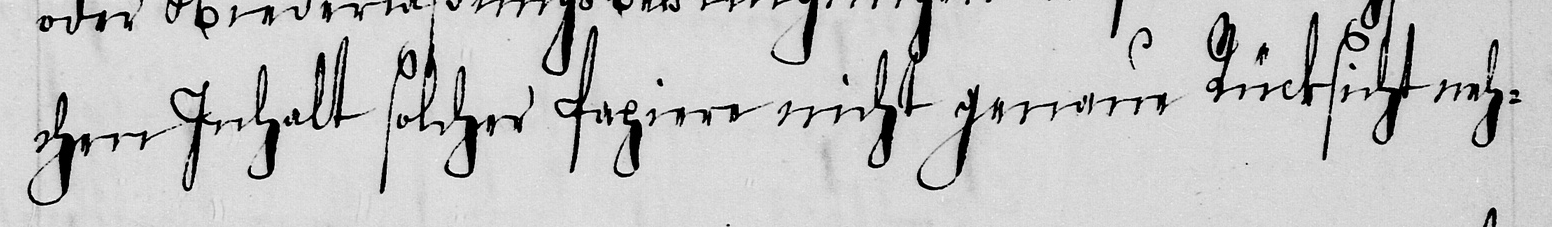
chen Inhalt solcher Papiere nicht genaue Rücksicht neh¬
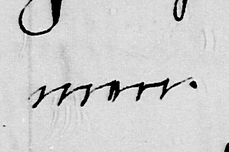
men.
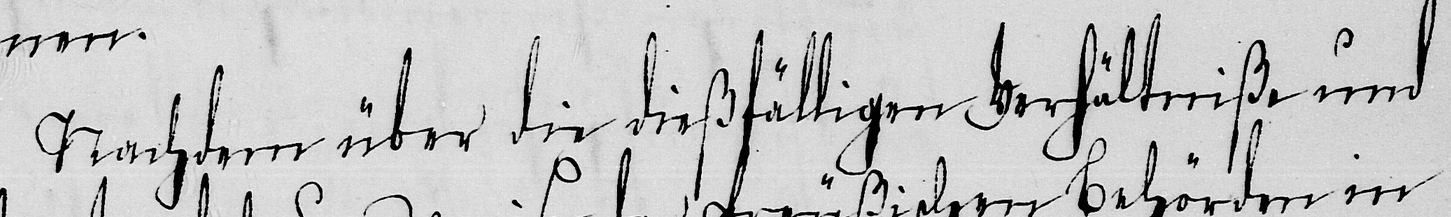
Nachdem über die dießfälligen Verhältniße und
